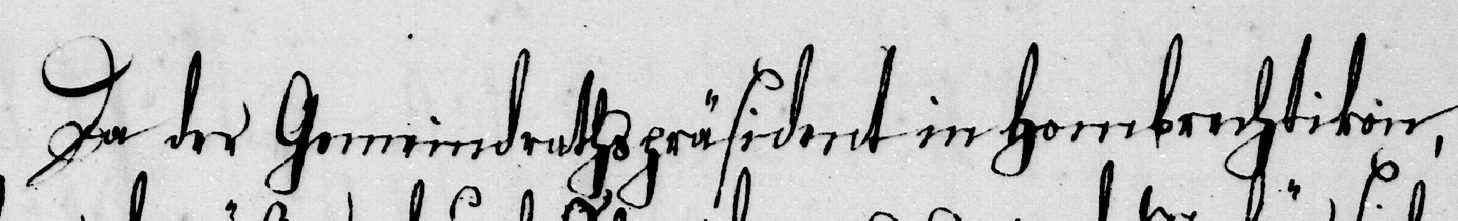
Da der Gemeindrathspräsident in Hombrechtikon,
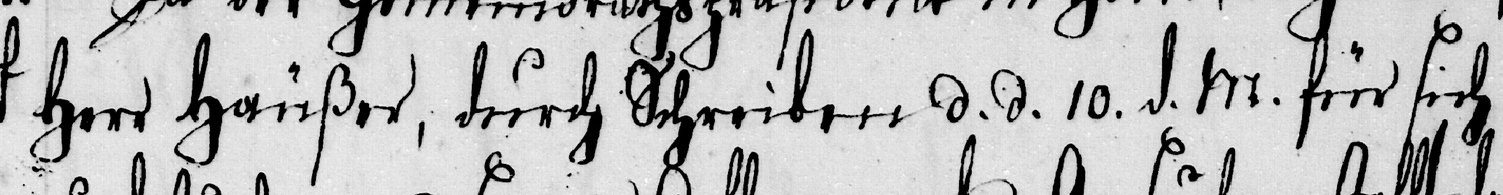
Herr Häußer, durch Schreiben d. d. 10. d. M. für sich
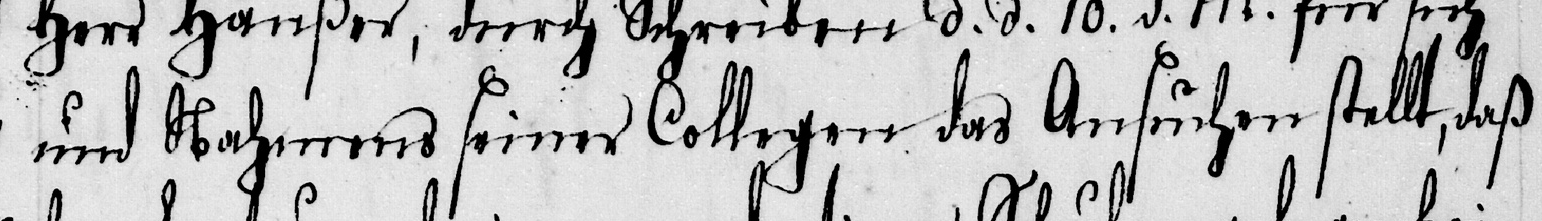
und Nahmens seiner Collegen das Ansuchen stellt, daß
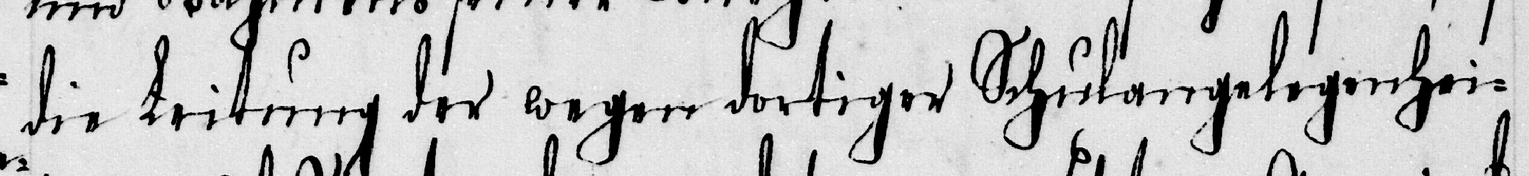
die Leitung der wegen dortiger Schulangelegenhei¬
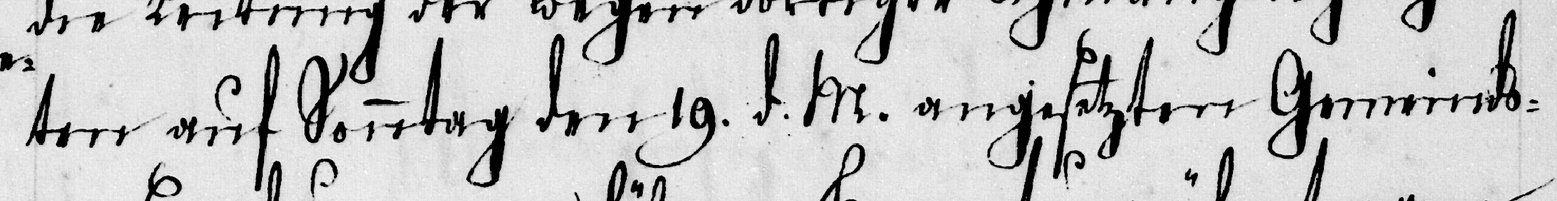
ten auf Sonntag den 19. d. M. angesetzten Gemeinds¬
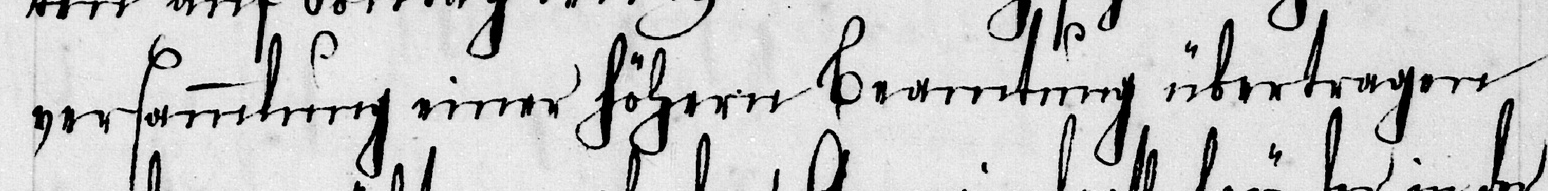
versammlung einer höhern Beamtung übertragen
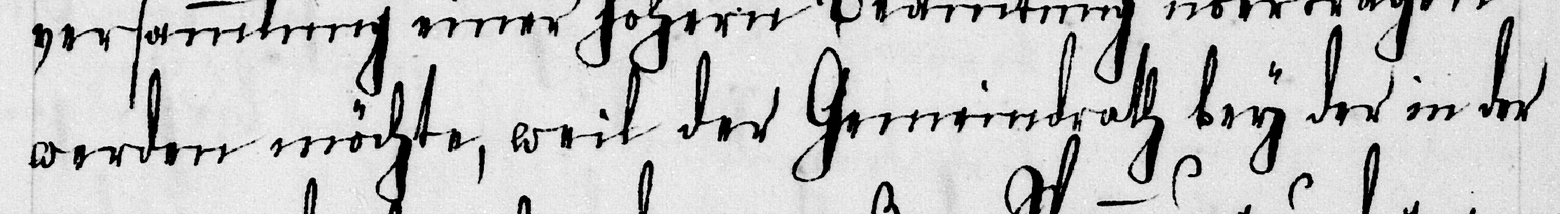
werden möchte, weil der Gemeindrath bey der in der
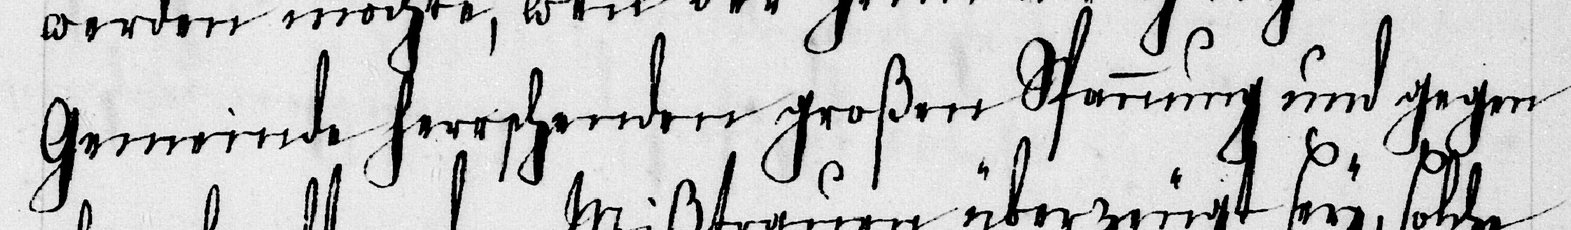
Gemeinde herrschenden großen Spannung und gegen
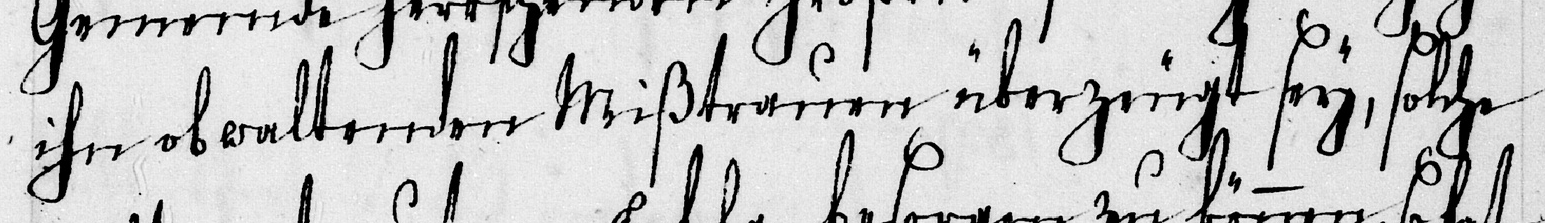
ihn obwaltenden Mißtrauen überzeugt sey, solche
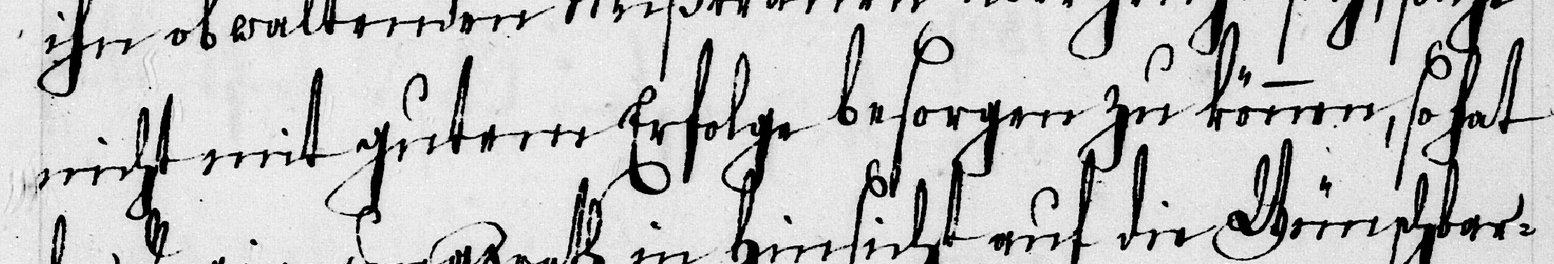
nicht mit gutem Erfolge besorgen zu können, so hat
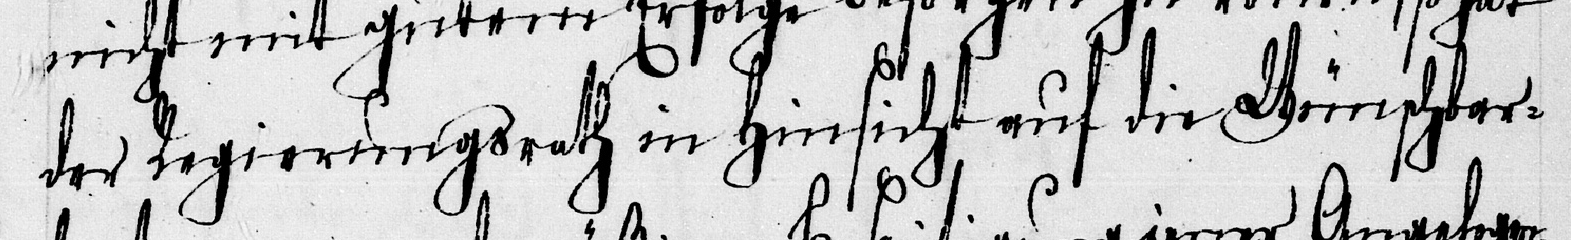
der Regierungsrath in Hinsicht auf die Wünschbar¬
